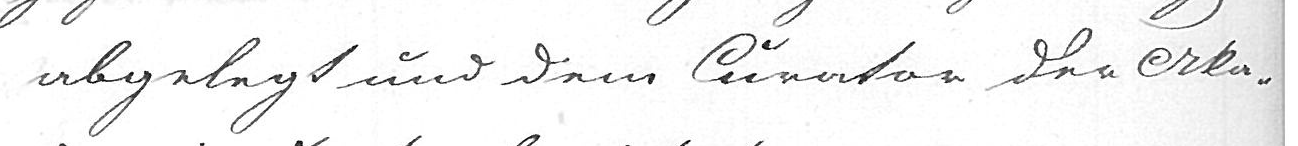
abgelegt und dem Curator der Aka-
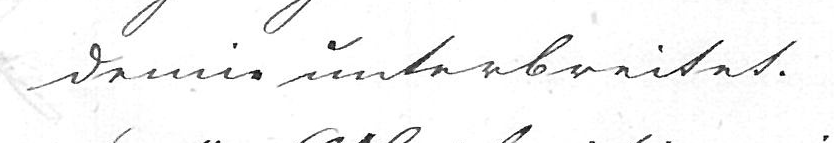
demie unterbreitet.
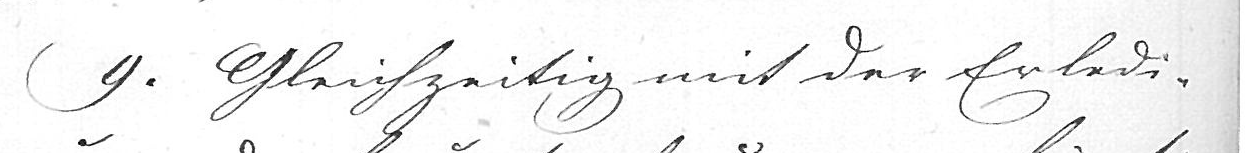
9. Gleichzeitig mit der Erledi-
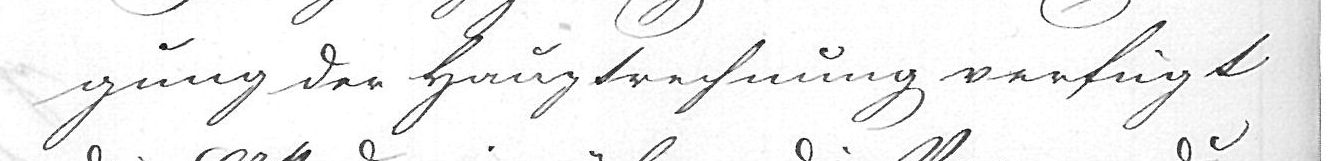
gung der Hauptrechnung verfügt
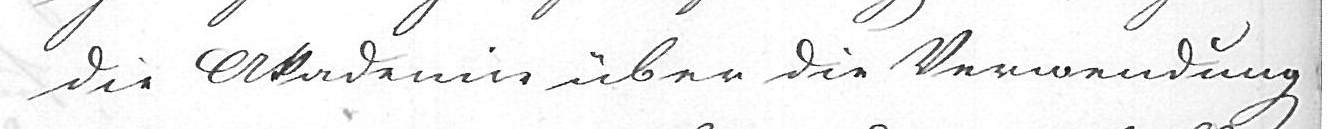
die Akademie über die Verwendung
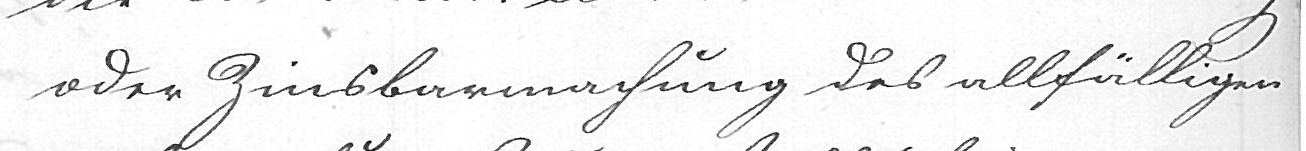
oder Zinsbarmachung des allfälligen
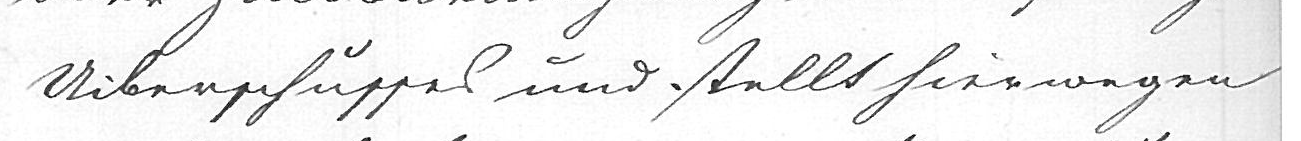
Uiberschusses und stellt hierwegen
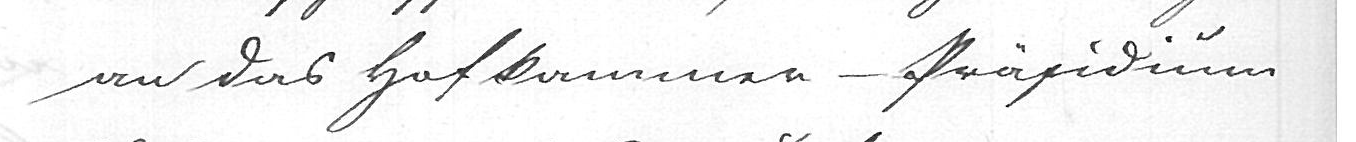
an das Hofkammer-Präsidium
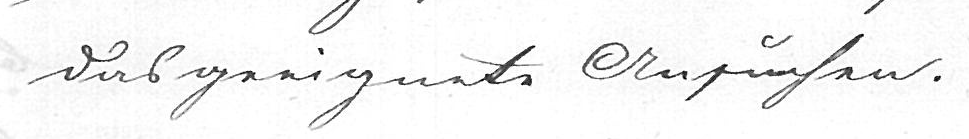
das geeignete Ansuchen.
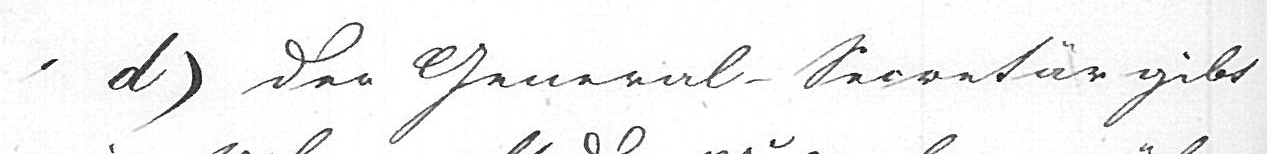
d) der General-Secretär gibt
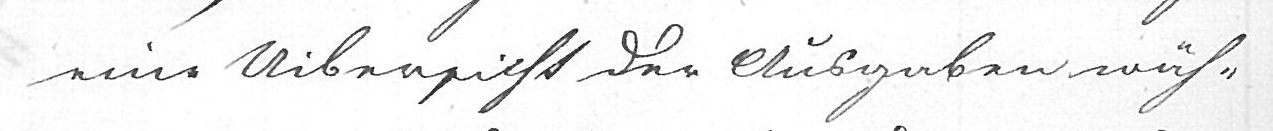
eine Uibersicht der Ausgaben wäh-
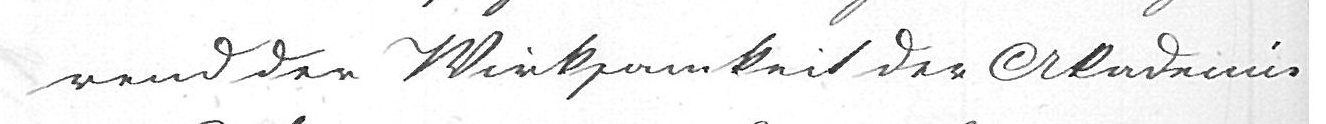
rend der Wirksamkeit der Akademie
